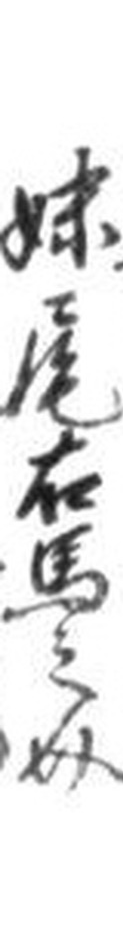妹尾右馬之介
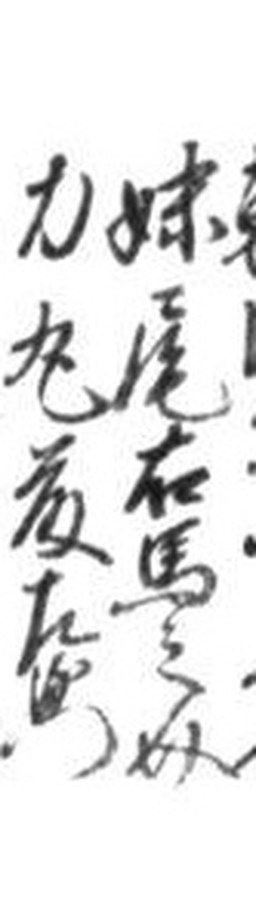力丸藤左衛門
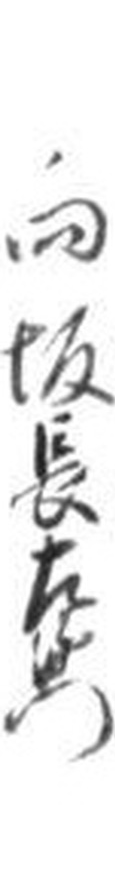向坂長左衛門
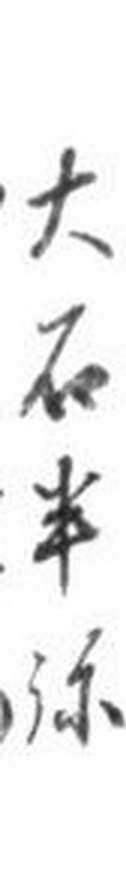大石半弥
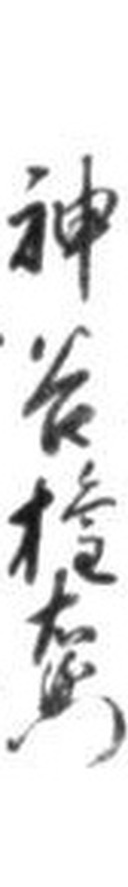神谷権右衛門
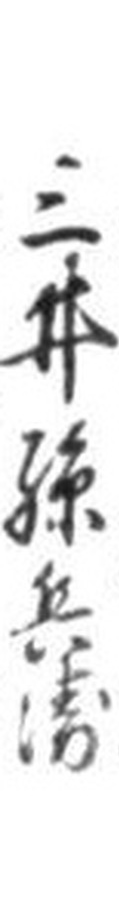三井孫兵衛
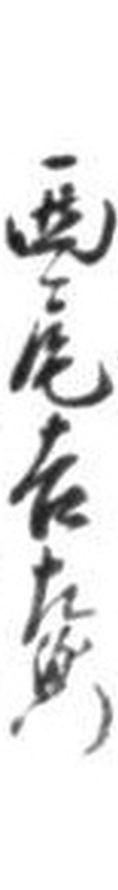西尾吉左衛門
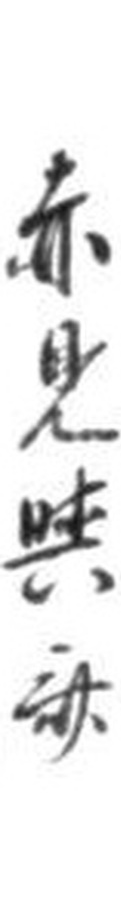赤見与斎
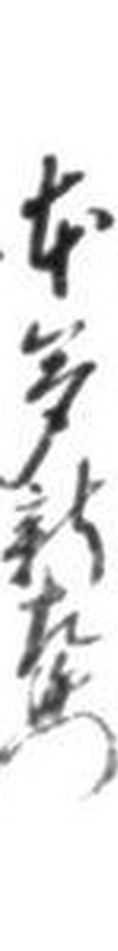本多新左衛門
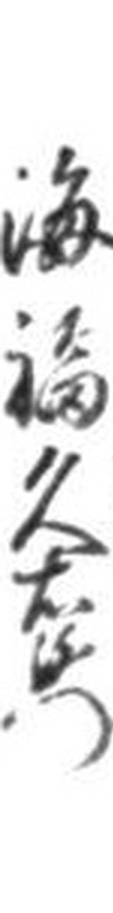海福久右衛門
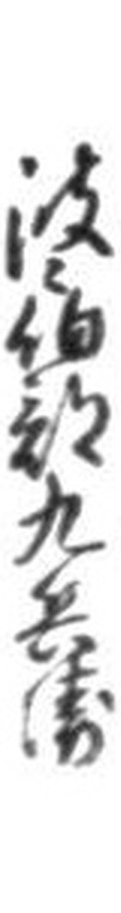波々伯部九兵衛
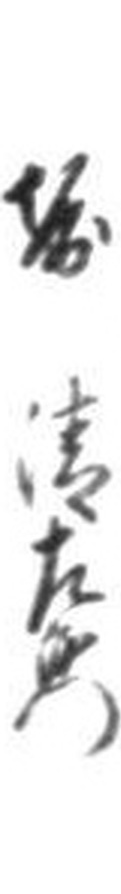堀清左衛門
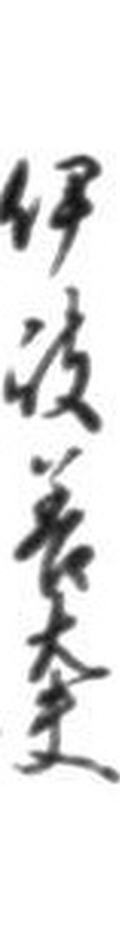伊岐善大夫
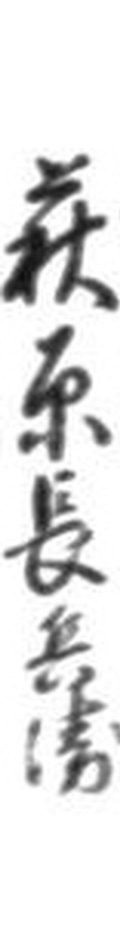萩原長兵衛
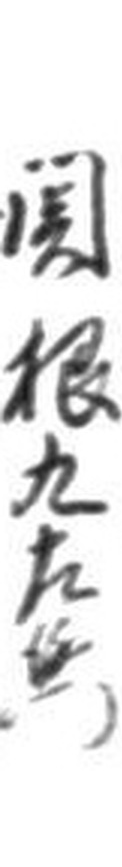関根九左衛門
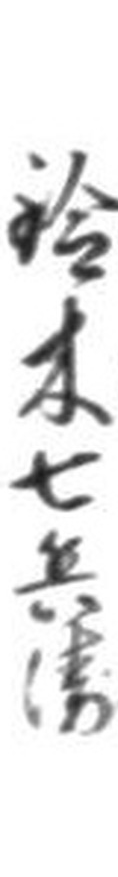鈴木七兵衛
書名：家譜 二 忠直公 従文禄四年到慶安四年
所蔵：福井県文書館 Fukui Prefectural Archives
